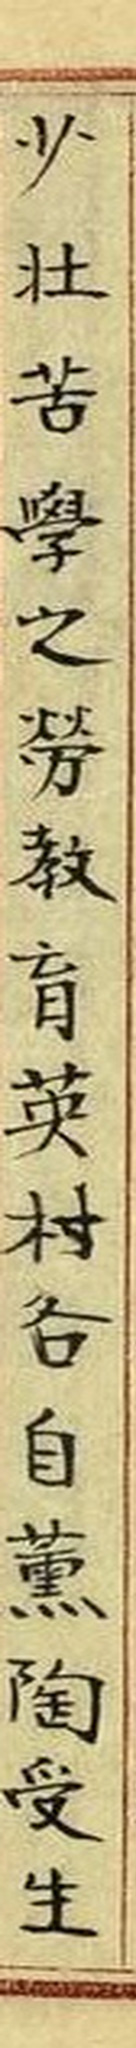少壮苦學之勞教育英村各自薫陶受生
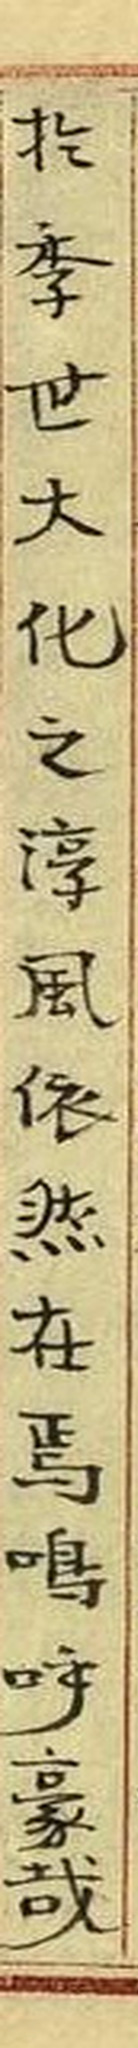於季世大化之淳風依然在焉嗚呼豪哉
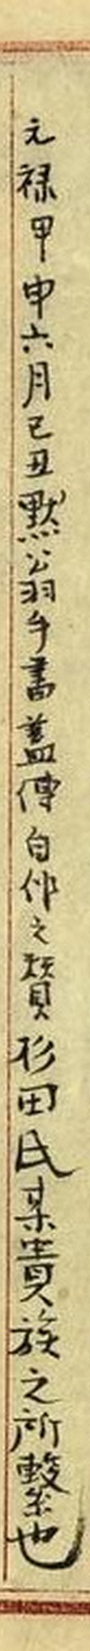元禄甲申六月己丑黙翁手書盖傳自作之賛杉田氏某貴族之所繋也

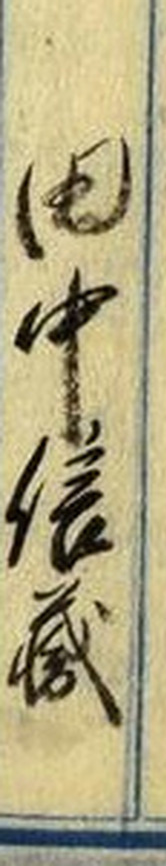田中信蔵
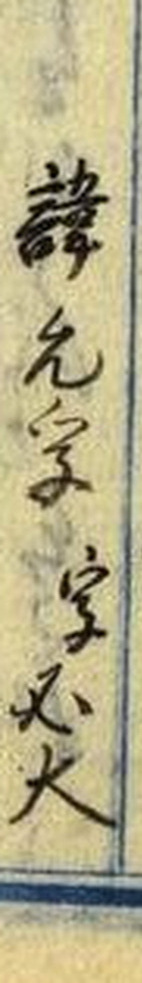諱允孚字必大
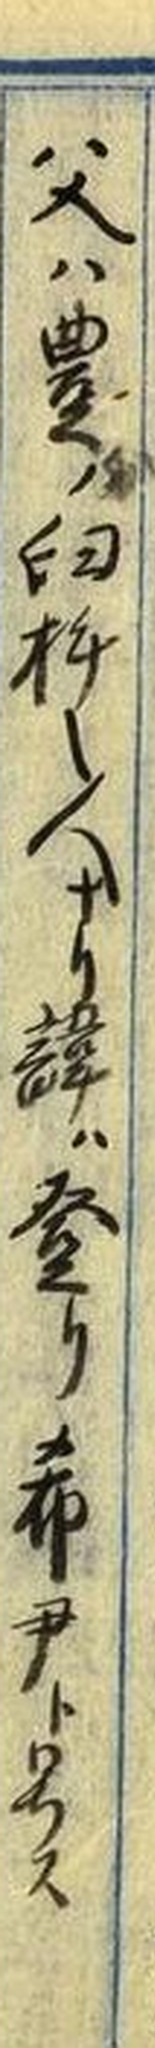父は豊州の臼杵之人なり諱は登り希尹と号す
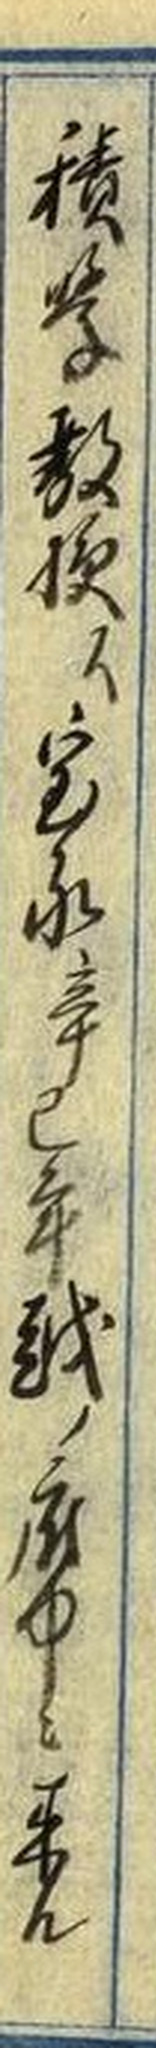積学教授す宝永辛巳年越の府中に来る
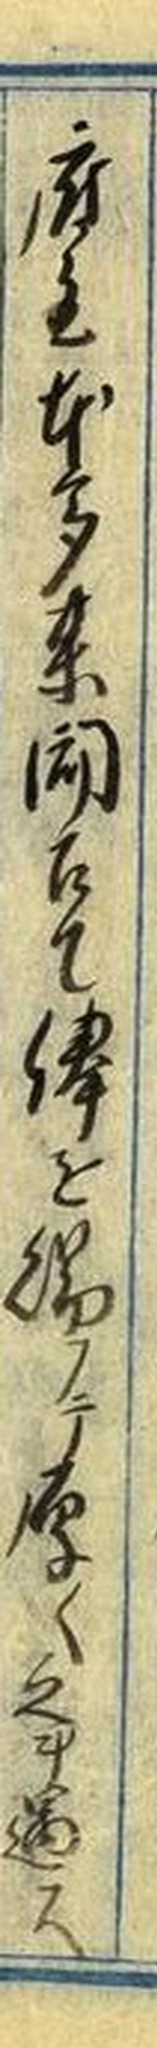府主本多某聞召て俸を賜ふて厚く之を遇す
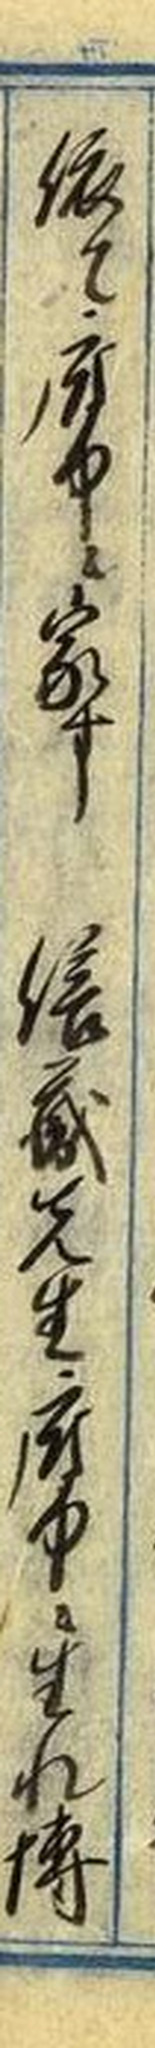依て府中に家す信蔵先生府中に生まれ博
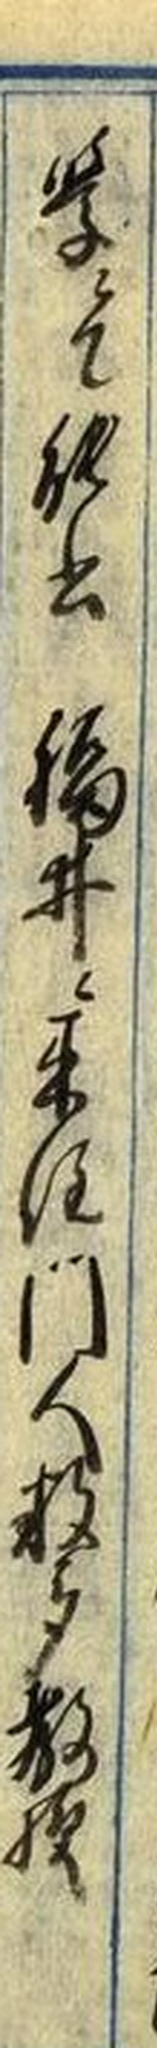学にて能書福井に来住門人数多教授
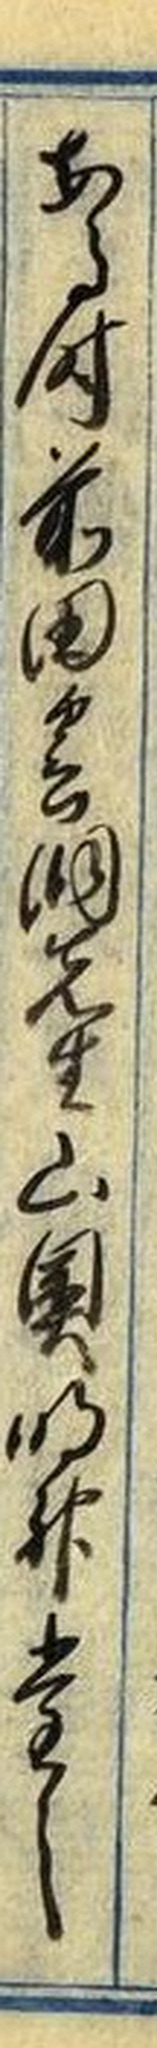ある時前田雲洞先生山奥明神堂之
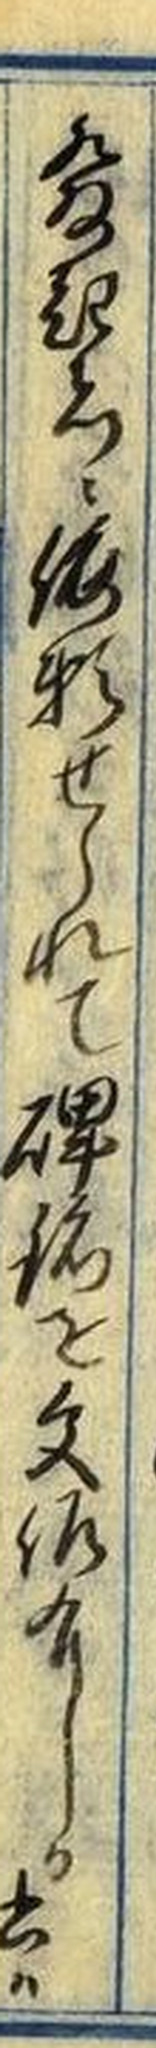発起者に依頼せられて碑銘を文作有しか書は

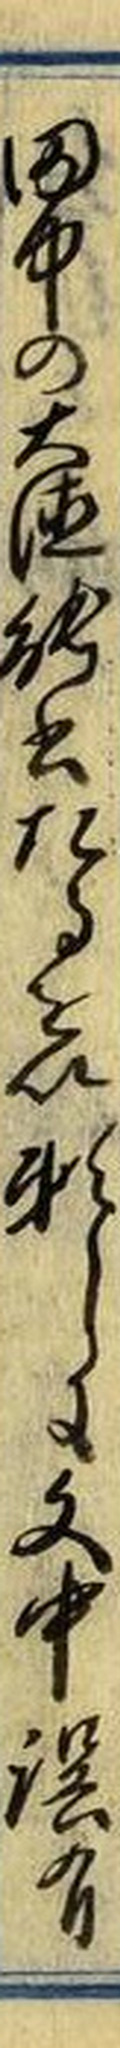田中の大徳能書たるを以頼しに文中誤有
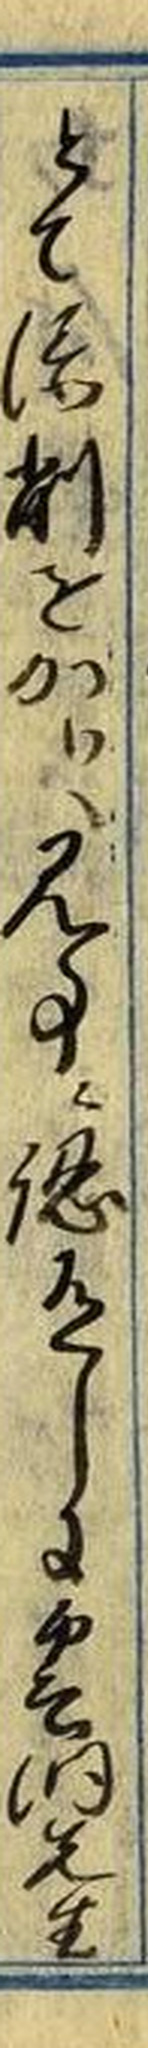とて添削を加わへ見事に認有しに雲洞先生
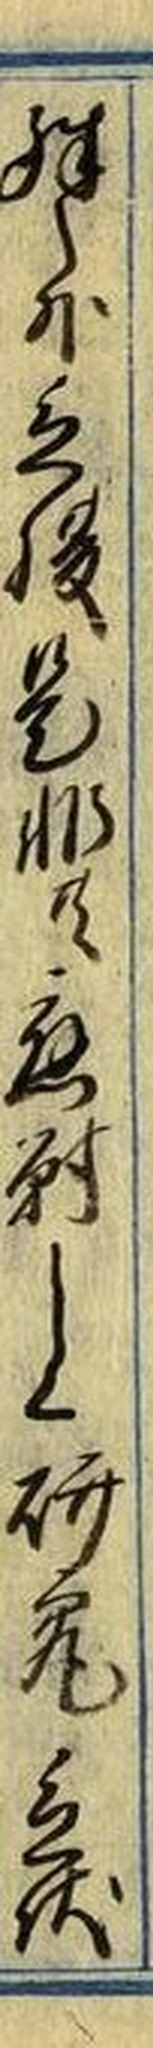殊之外立腹是非共応対し上研究立伏
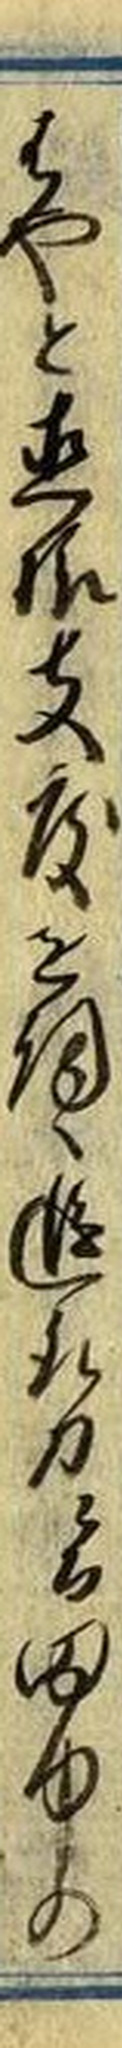はやと直様支度を調へ追取刀に而田中の
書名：温古集 四巻
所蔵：福井県文書館 Fukui Prefectural Archives
